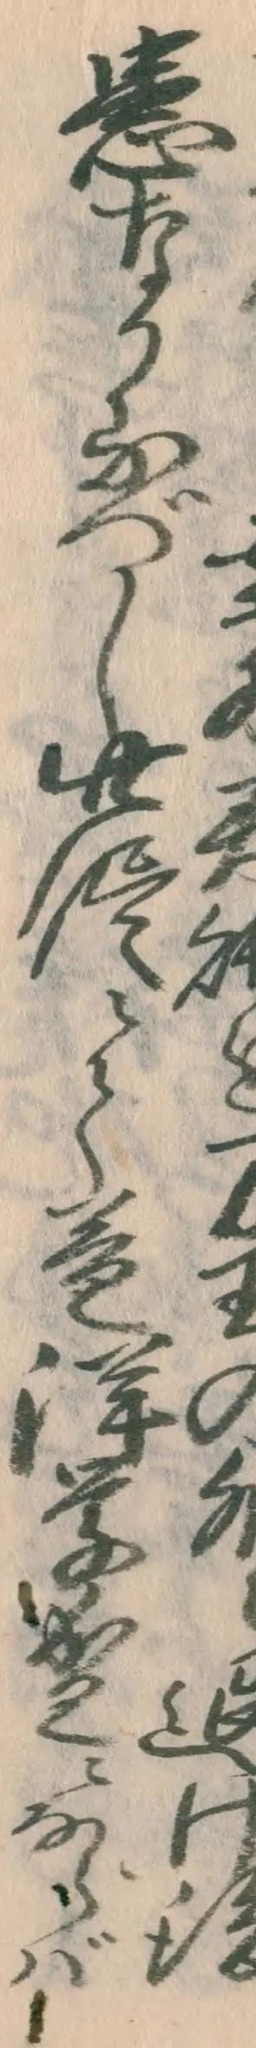患なかるべし此儘ニて益洋学盛ニならバ
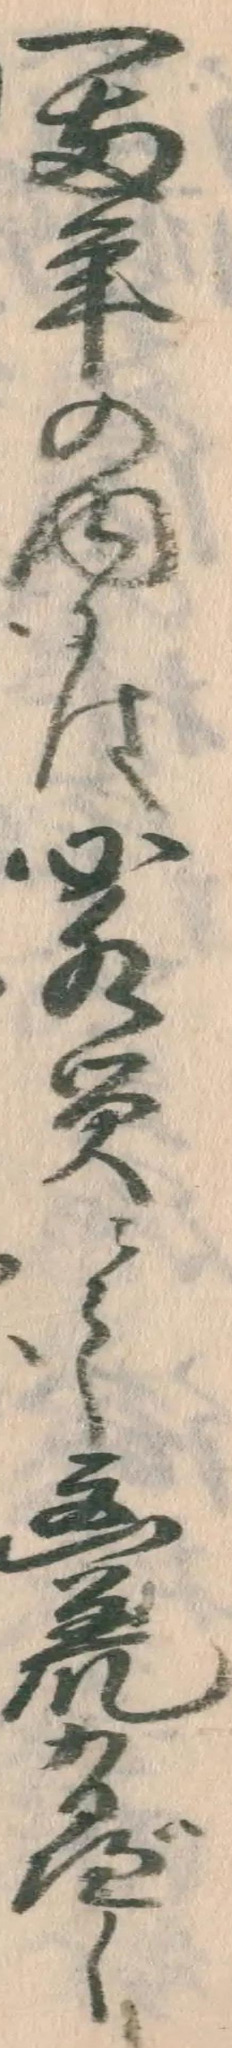一両年の内には必水災ニて凶荒有べし
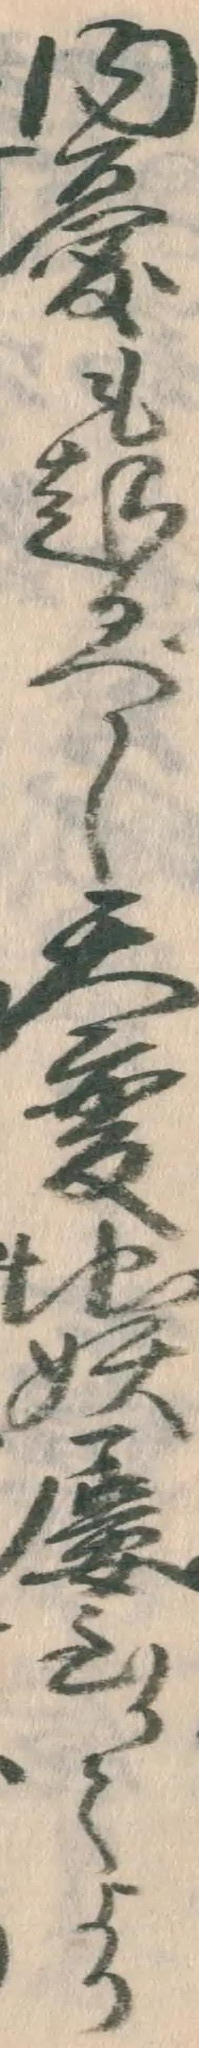内憂も起るべし天変地妖屢至りてより
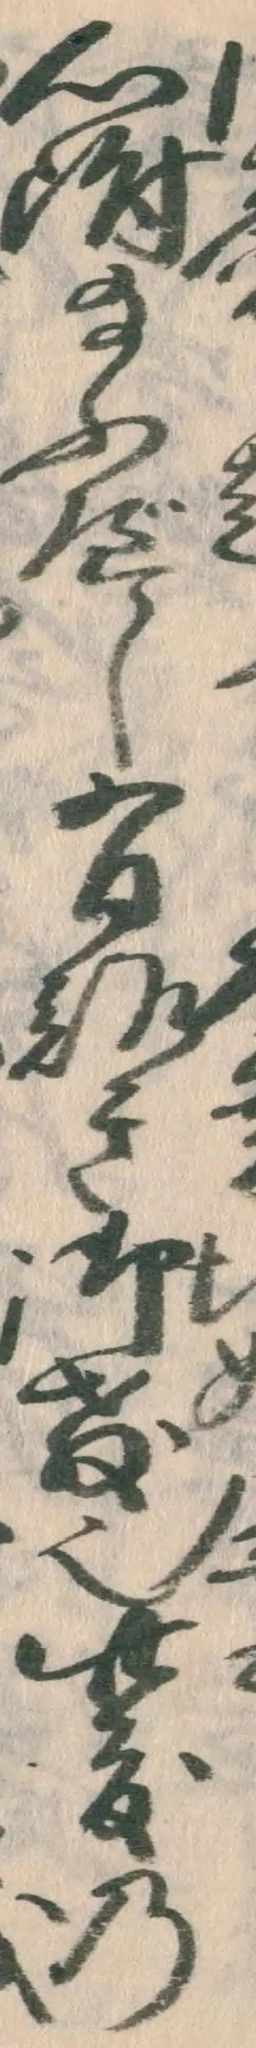心附給ふべし有難き御教也此度の
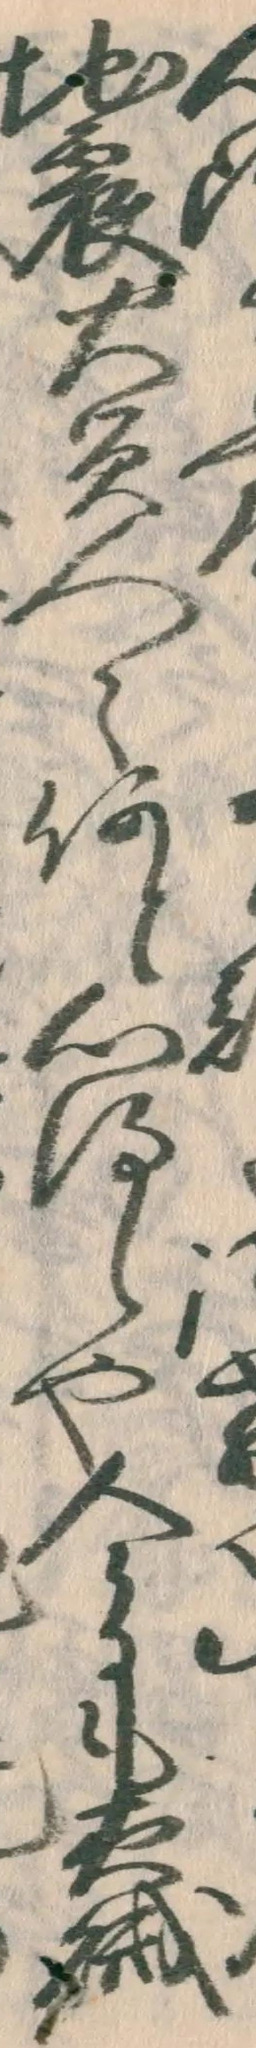地震火災人の何と心得しや今にも夷賊
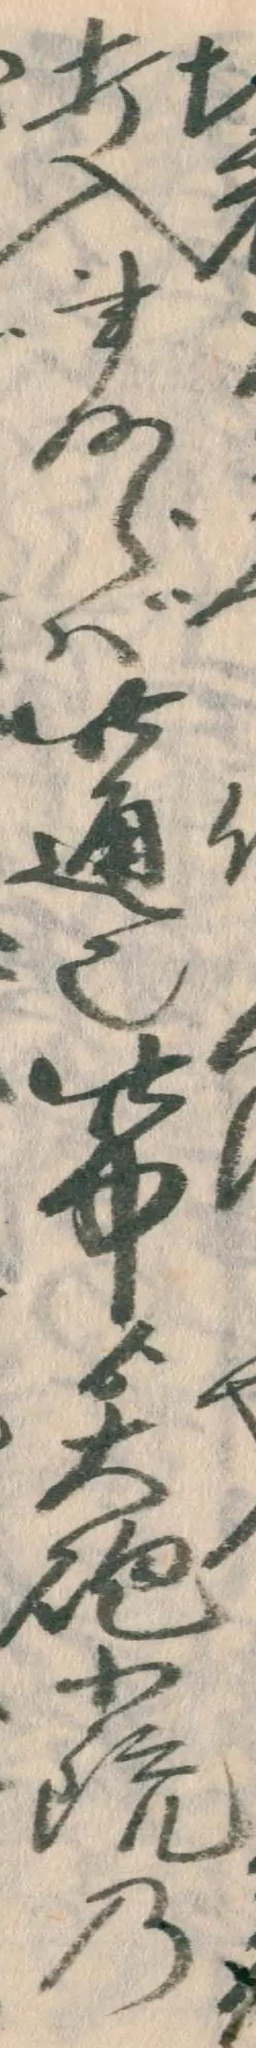打入事あらバ此通也此中ゟ大砲小銃の
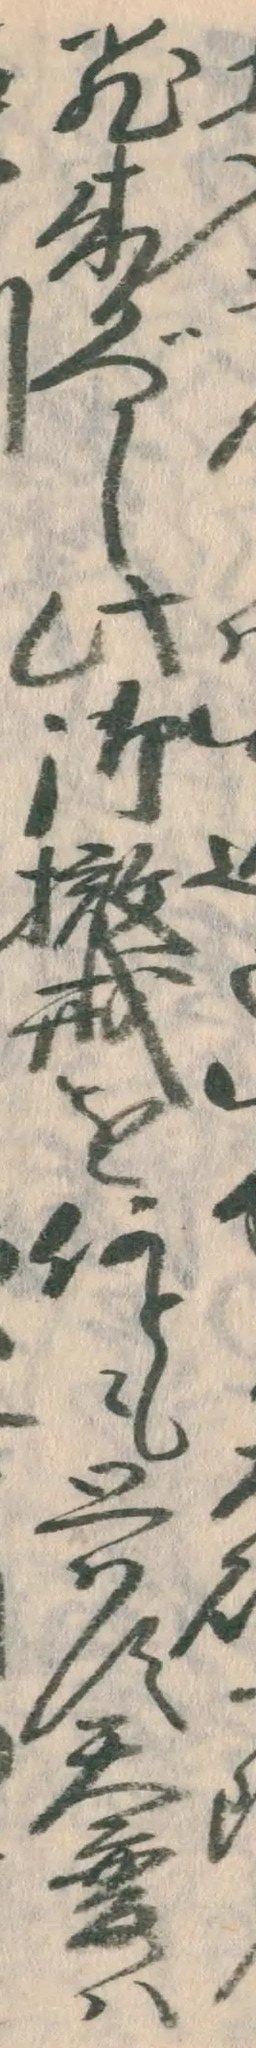飛来るべし此御撤戒を何とも思ハす天変ハ
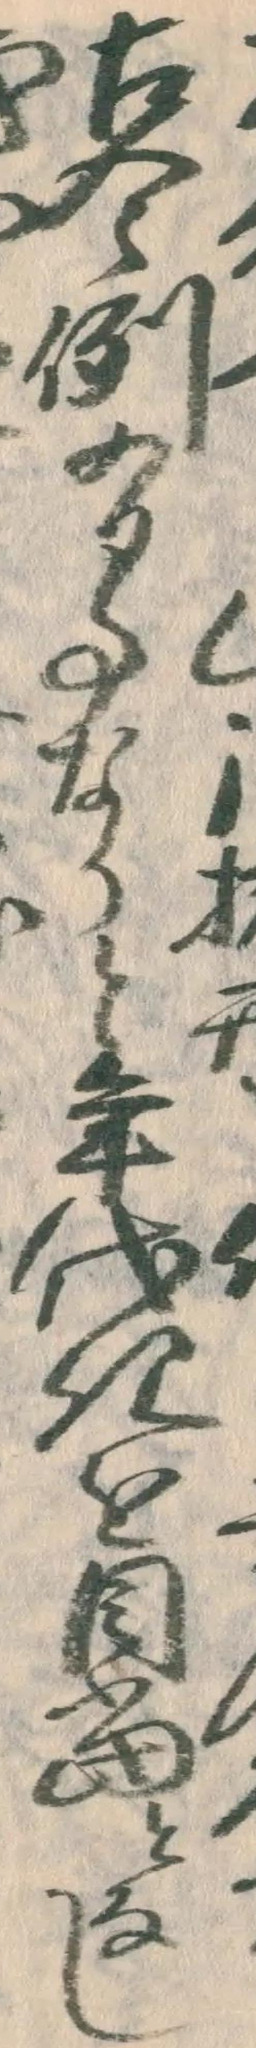古今例有事なりと年代記を目當となし
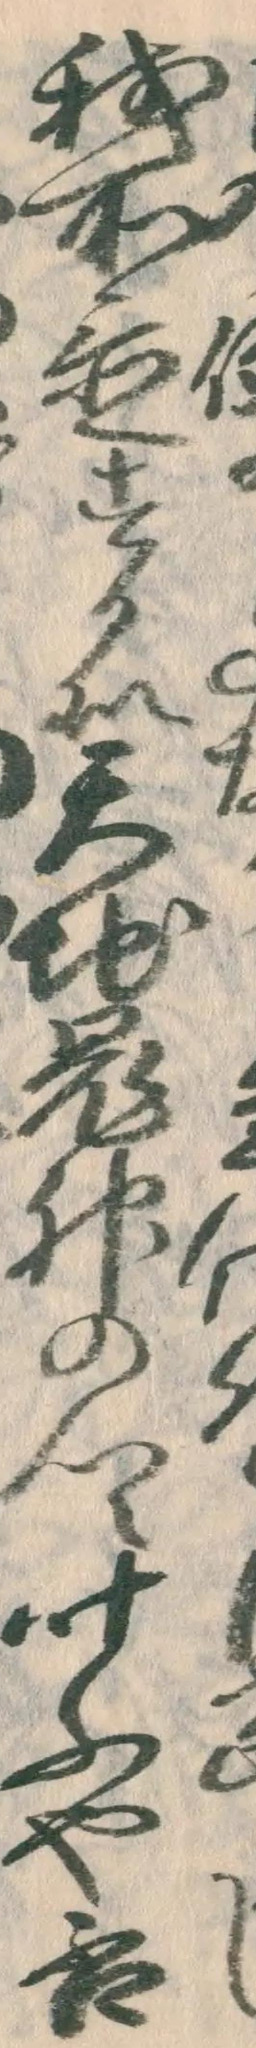我所置する処天地鬼神の心ニ叶ふや否
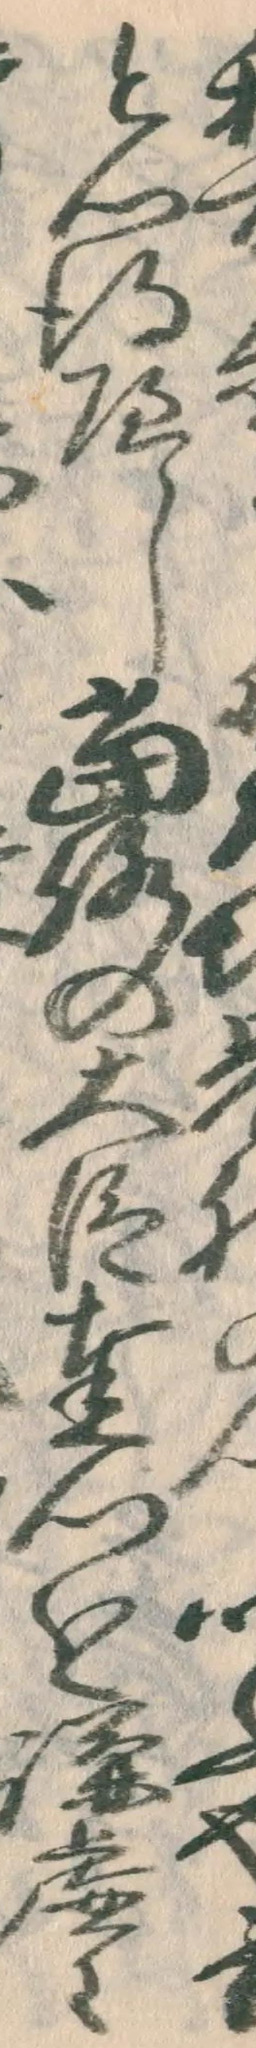と心得へし當路の大臣達心を謙虚に
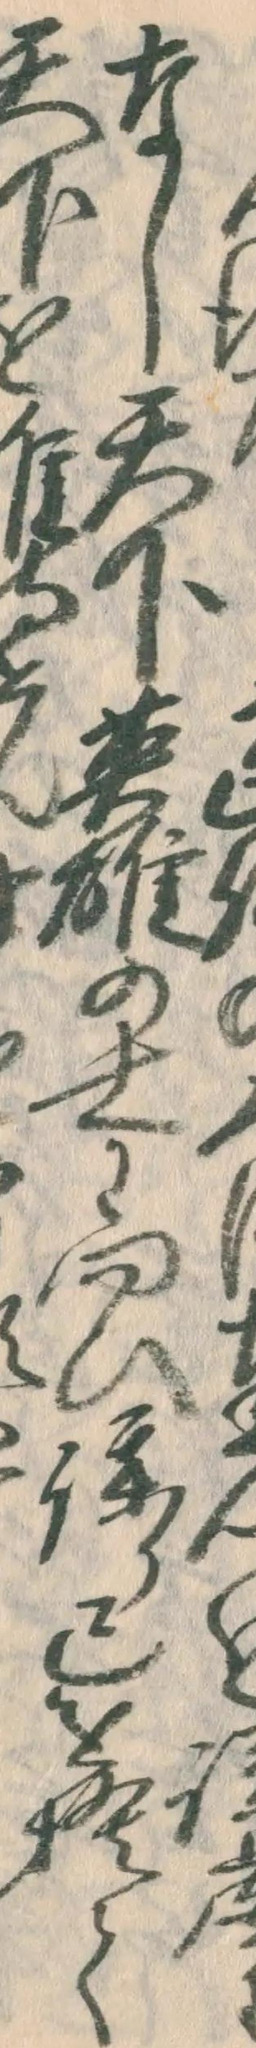なし天下英雄の士に向ひ謀り己を捨て
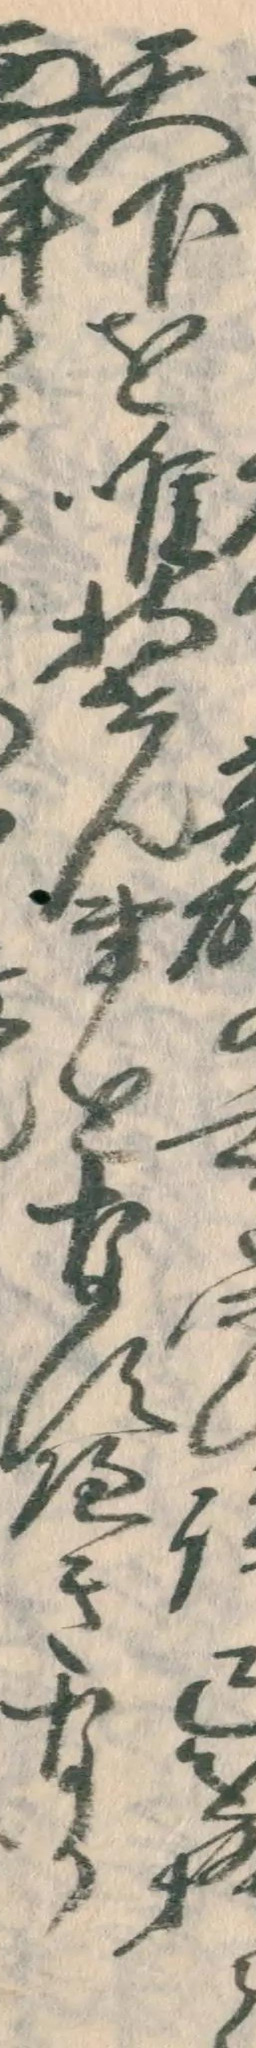天下を唯持せん事をなすへきなり
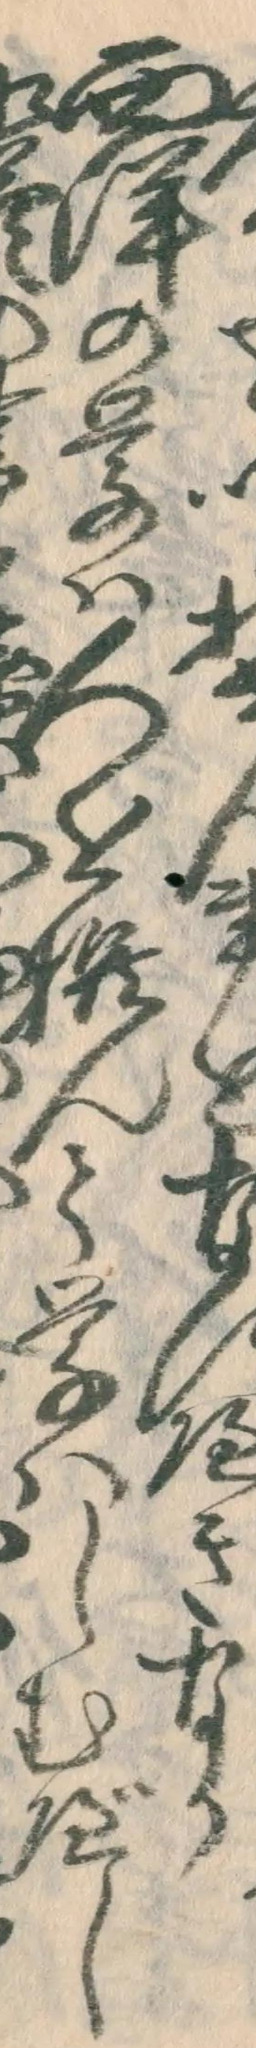一西洋の学ハ人を撰んて学ハしむべし
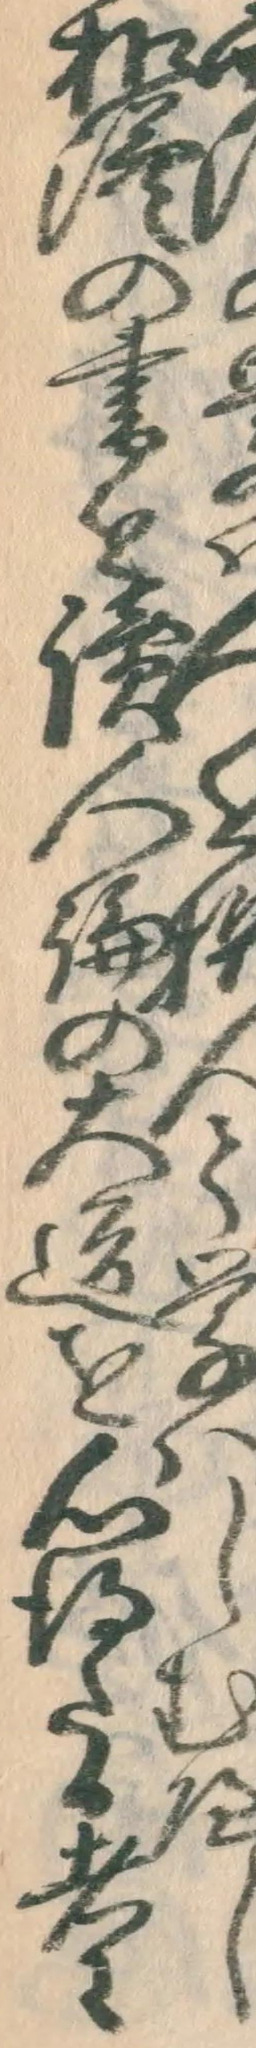和漢の書を讀人倫の大道を心得たる者に

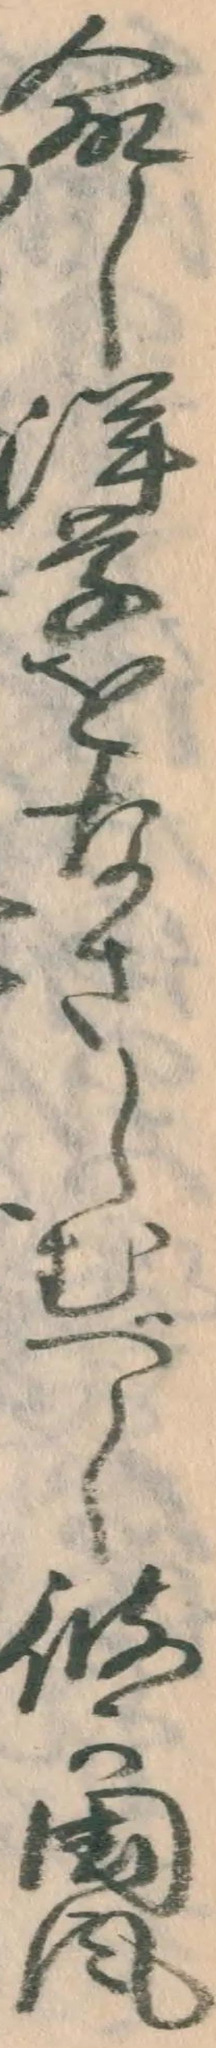命し洋学をなさしむべし彼か国風
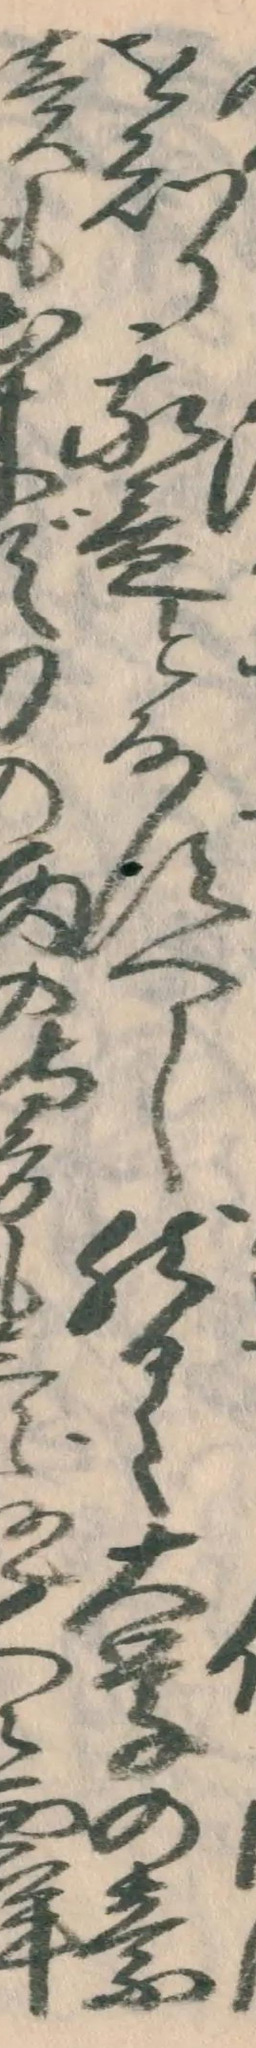を知り我益となすへし然るに大学の素
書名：麗斎叢書. 20
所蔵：国立国会図書館 National Diet Library, JAPAN
